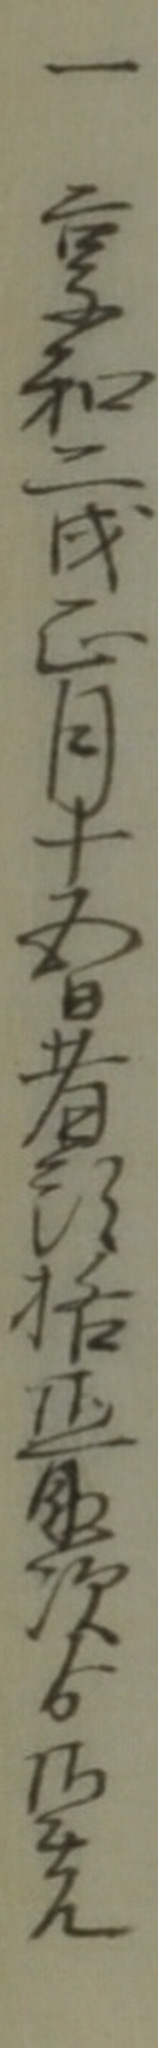一享和二戌正月十五日者頭格御取次ゟ御先
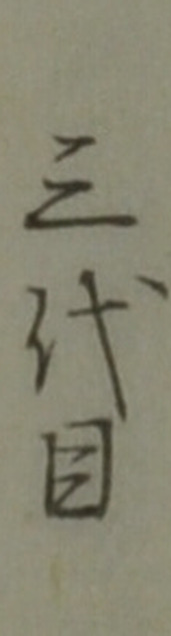三代目
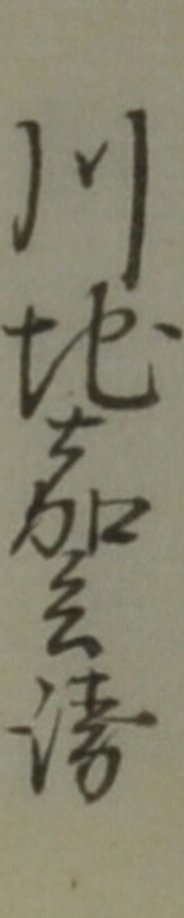川地嘉兵衛
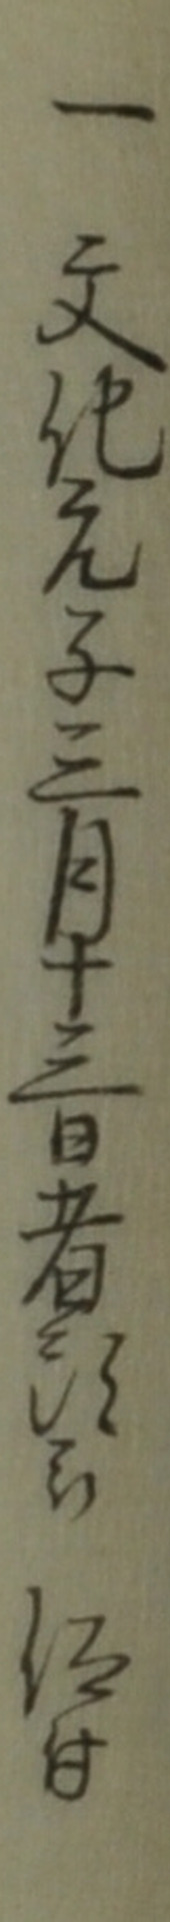一文化元子三月十三日者頭被仰付
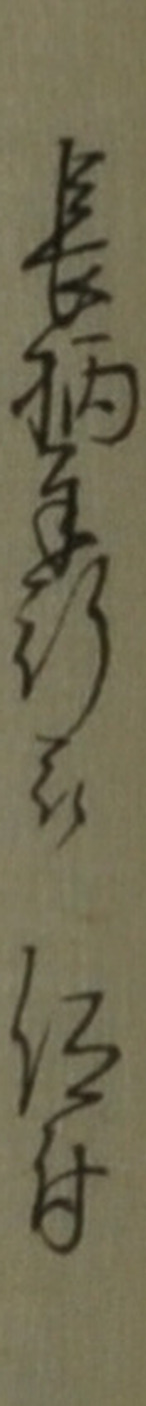長柄奉行被仰付
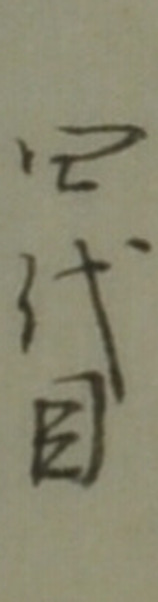四代目
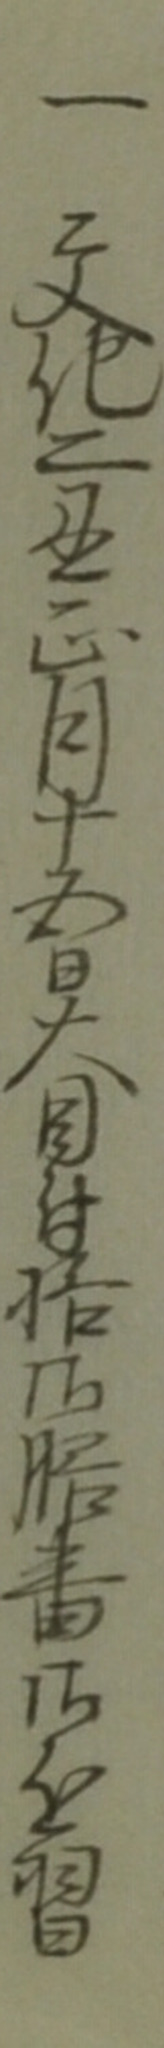一文化二丑正月十五日大目付格御膳番御近習
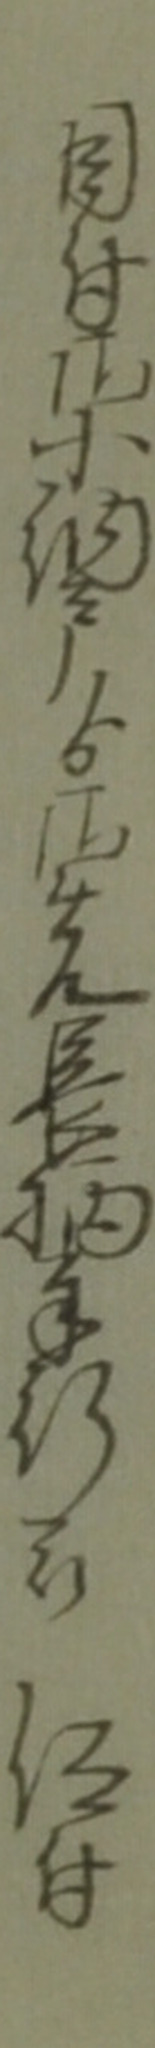目付御小納戸ゟ御先長柄奉行被仰付
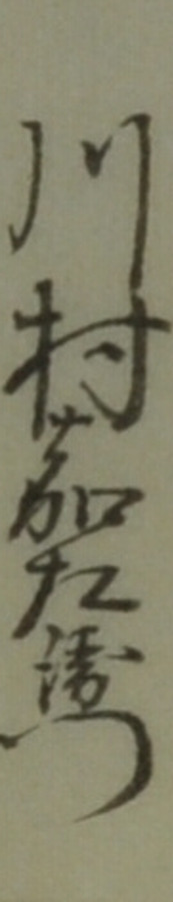川村嘉左衛門
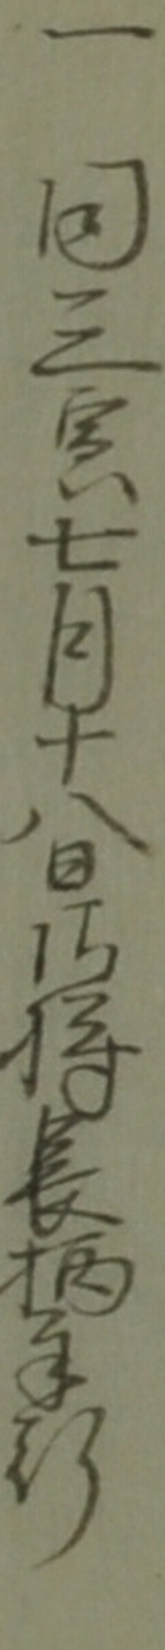一同三寅七月十八日御持長柄奉行
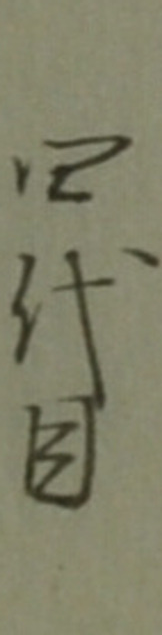四代目
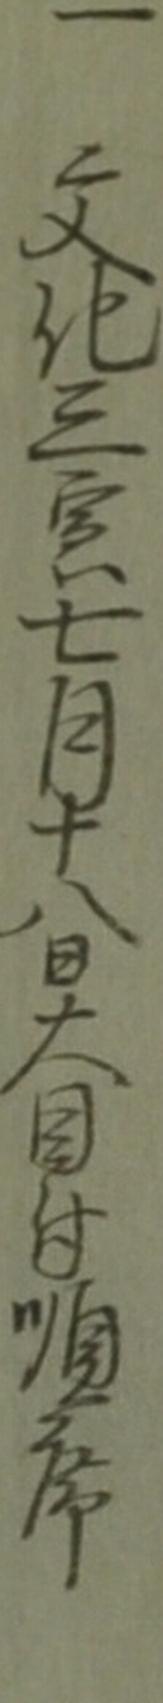一文化三寅七月十八日大目付順席
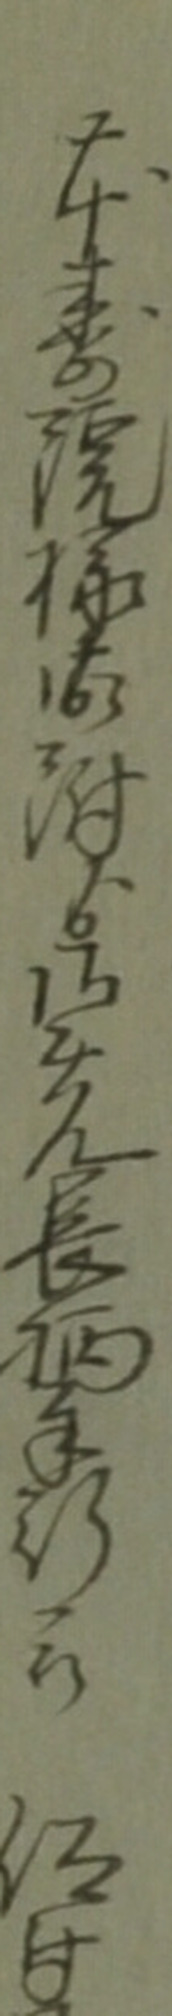本寿院様御附ゟ御先長柄奉行被仰付御附
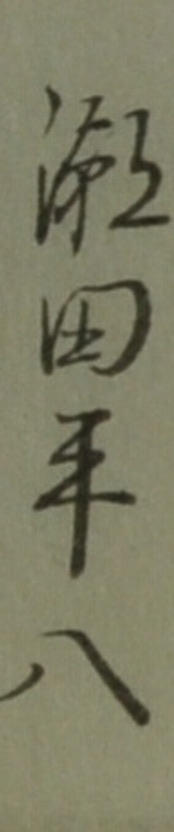潮田平八
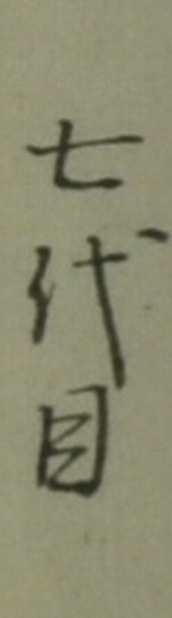七代目

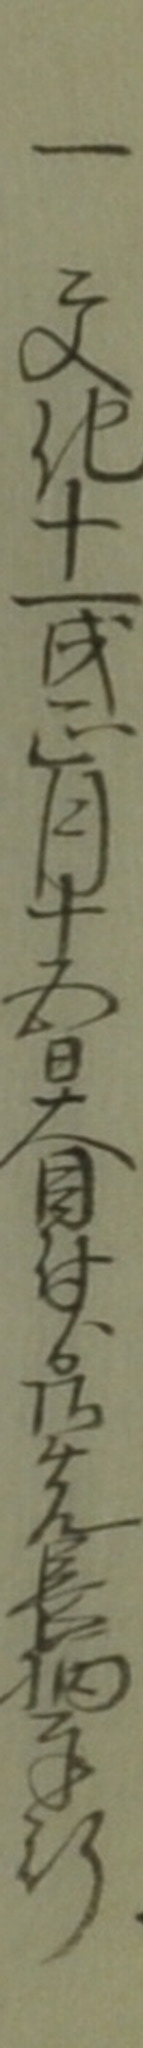一文化十一戌正月十五日大目付ゟ御先長柄奉行
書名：諸御役代々録（三）
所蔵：伊那市立高遠町図書館・合同会社AMANE
